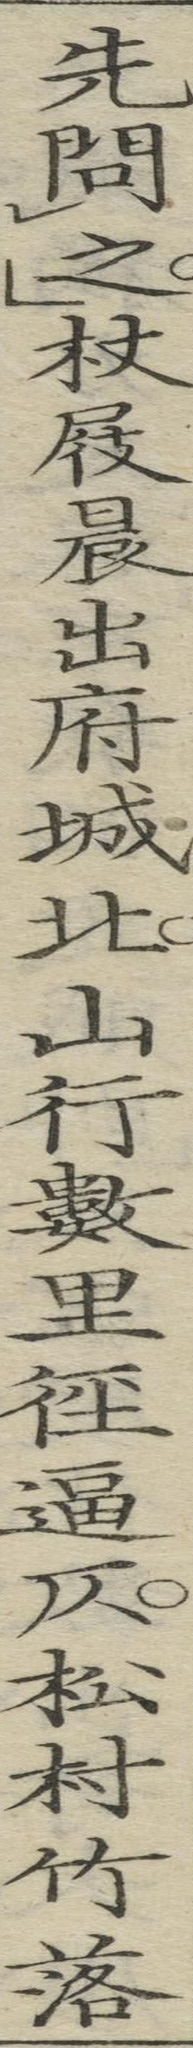先問之」杖屐晨出府城北山行数里径逼仄松村竹落
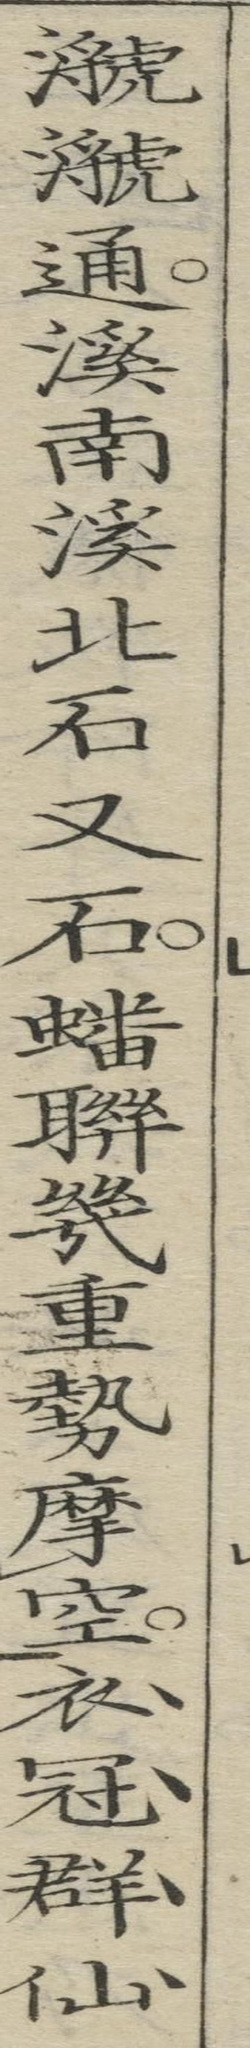滮滮通溪南溪北石又石蟠聯幾重勢摩空」衣冠群仙
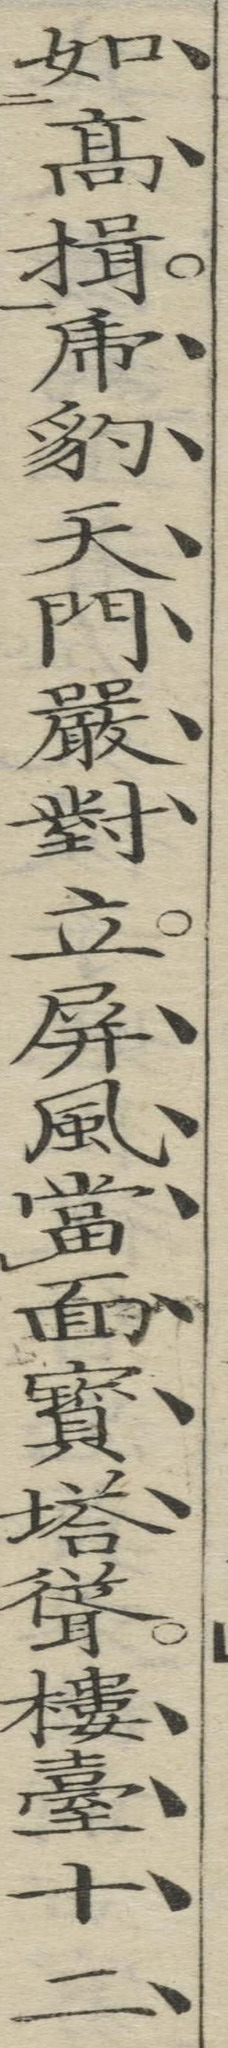如高揖虎豹天門厳対立屏風当面宝塔聳楼台十二
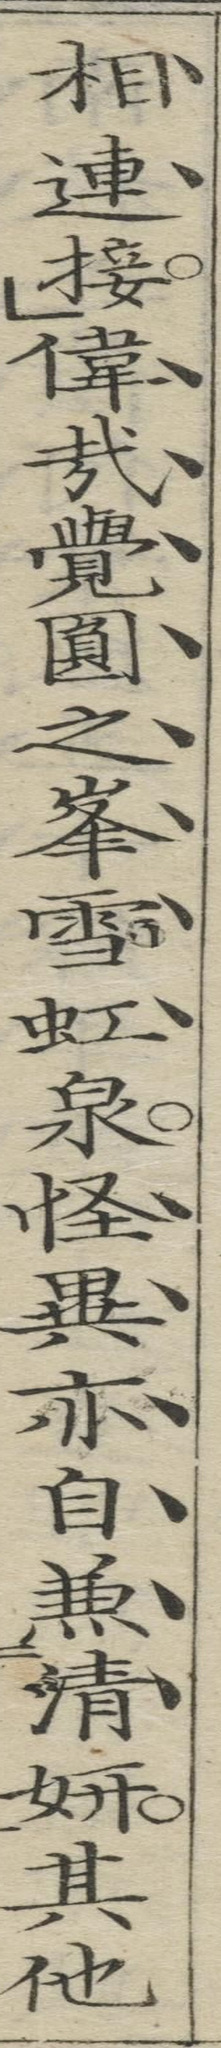相連接」偉哉覚円之峯雪虹泉怪異亦自兼清妍其他
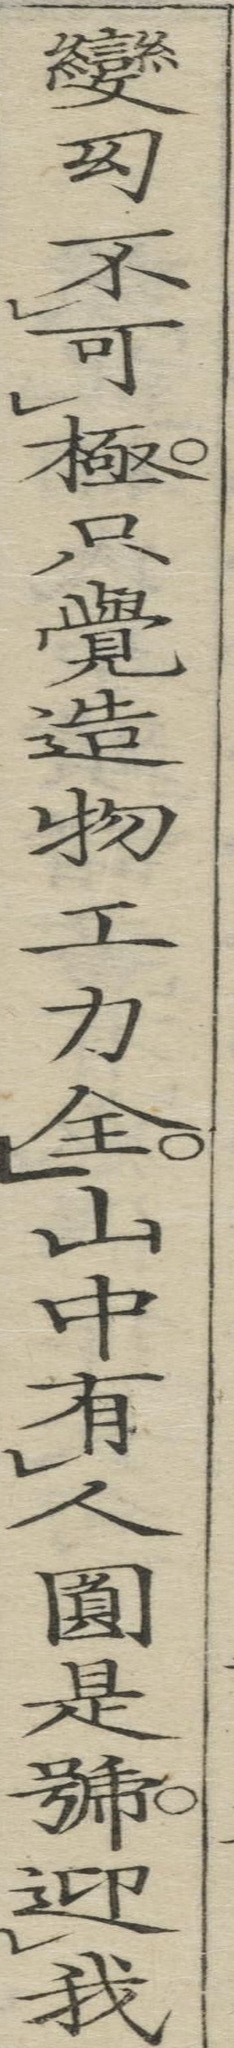変幻不可極只覚造物工力全」山中有人円是号迎我
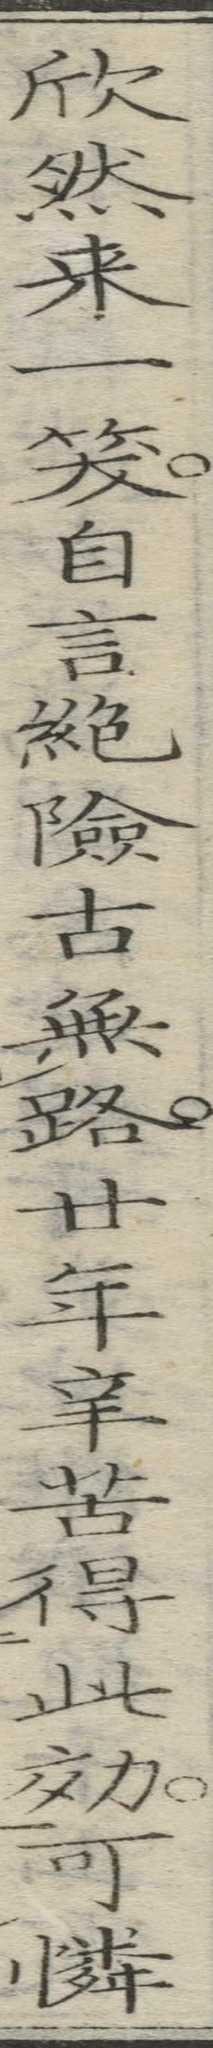欣然来一茇自言絶険古無路廿年辛苦得此効」可憐
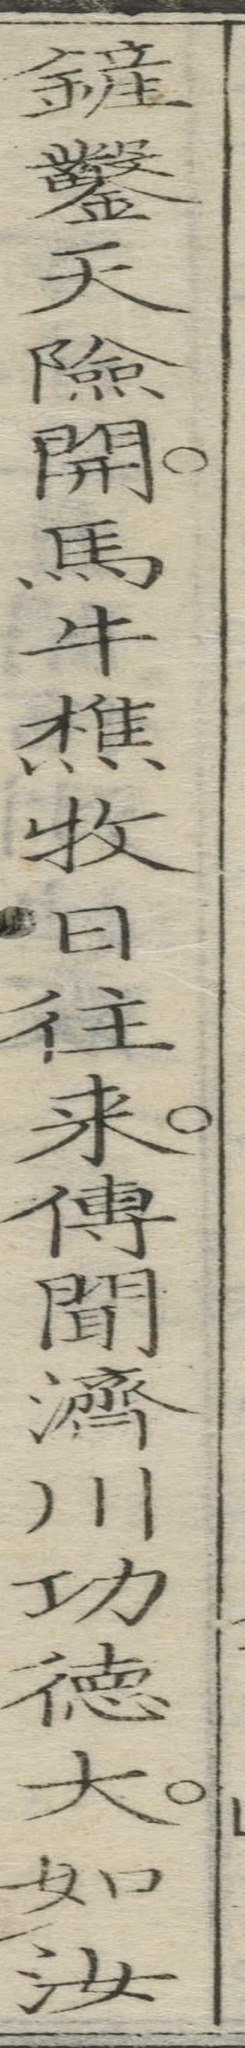鏟鑿天険開馬牛樵牧日往来伝聞済川功徳大如汝
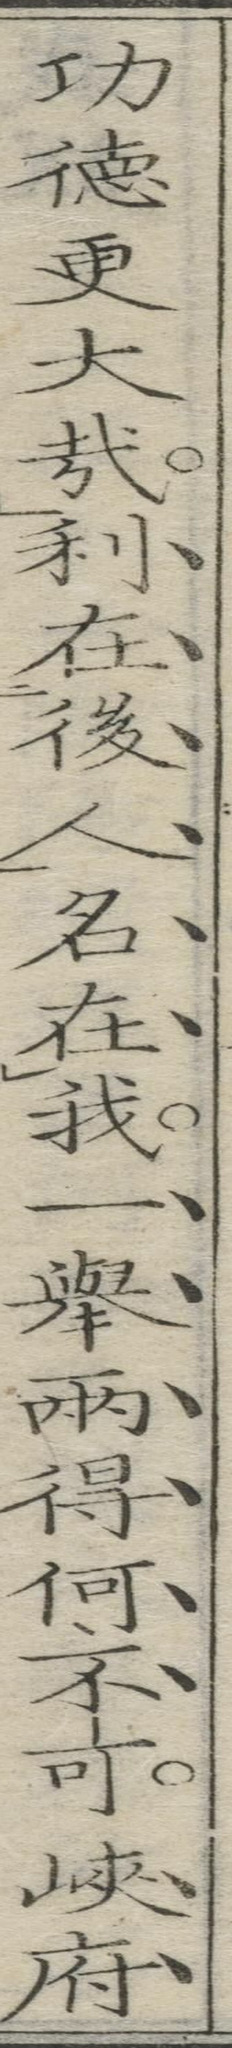功徳更大哉」利在後人名在我一挙両得何不-可峡府
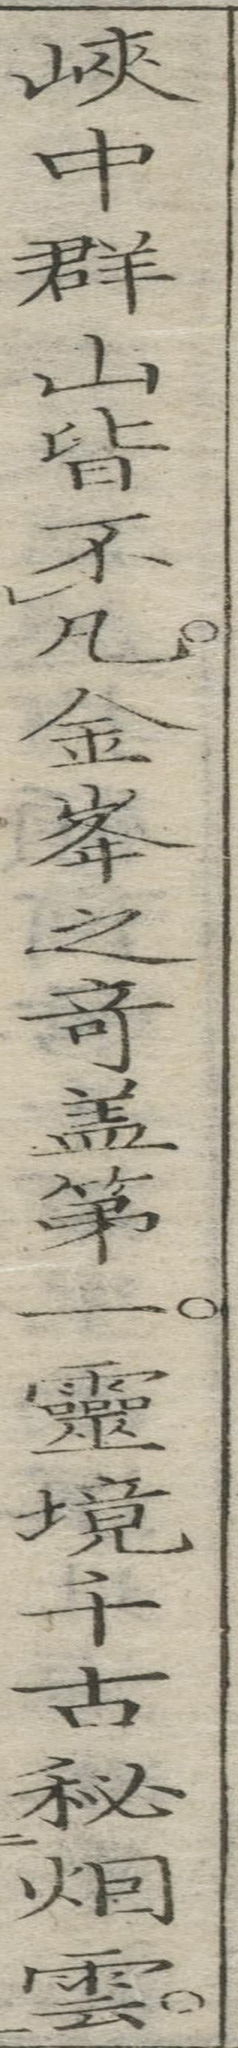峡中群山皆不凡金峯之奇蓋第一霊境千古秘煙雲
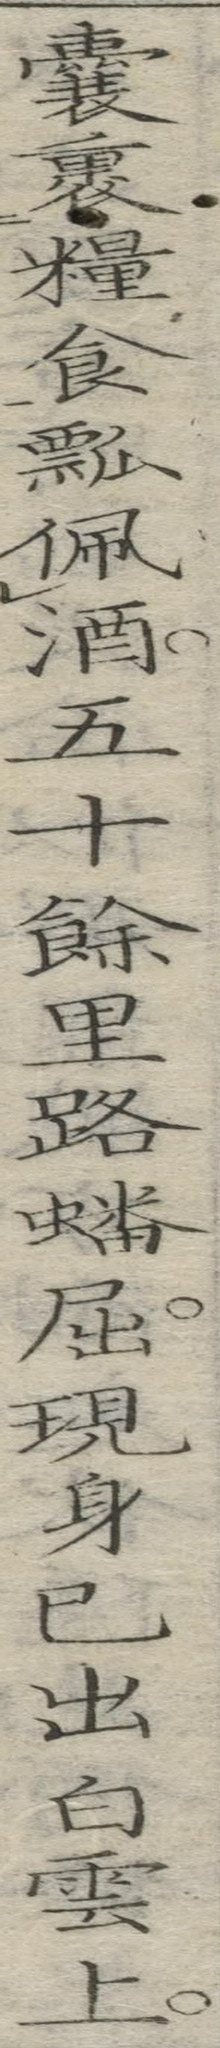嚢裏糧食瓢佩酒五十餘里路蟠屈現身已出白雲上
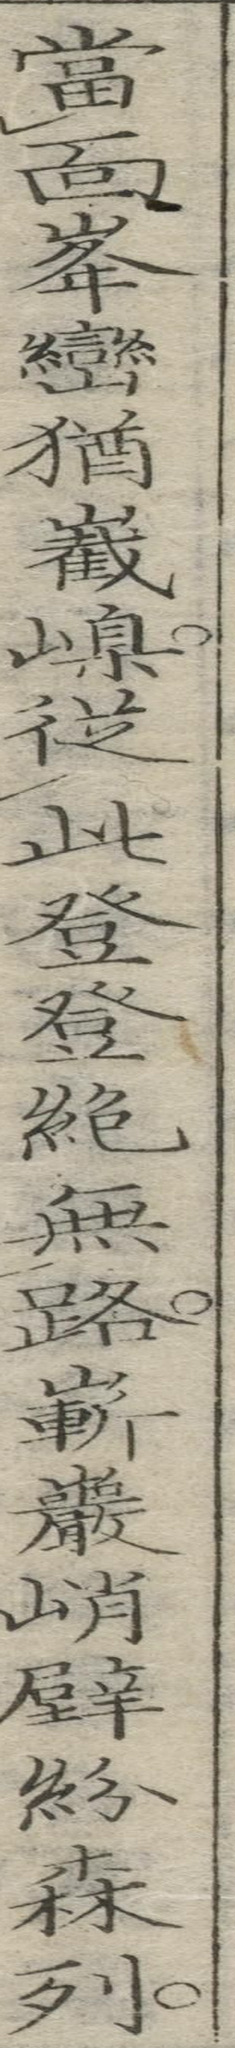当面峯巒猶嶻嵲従此登登絶無路嶄巌峭辟紛森列
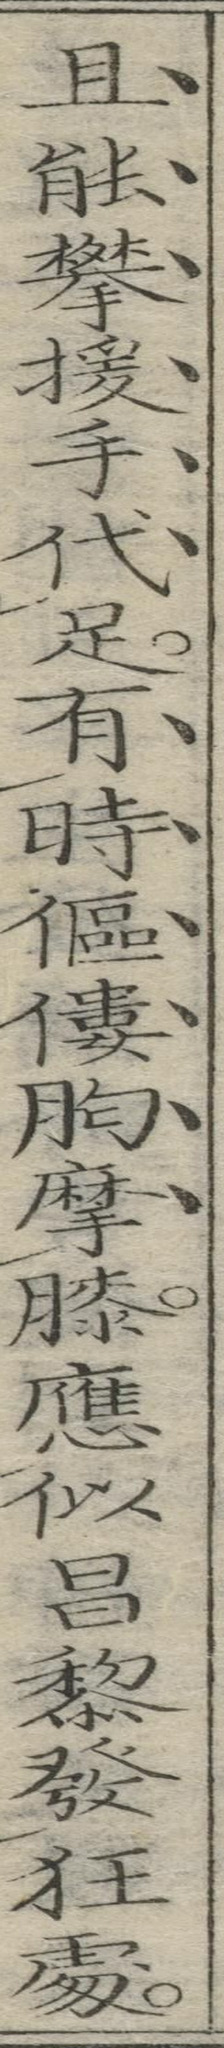且能攀援手代足有時傴僂胸摩膝応似昌黎発狂処

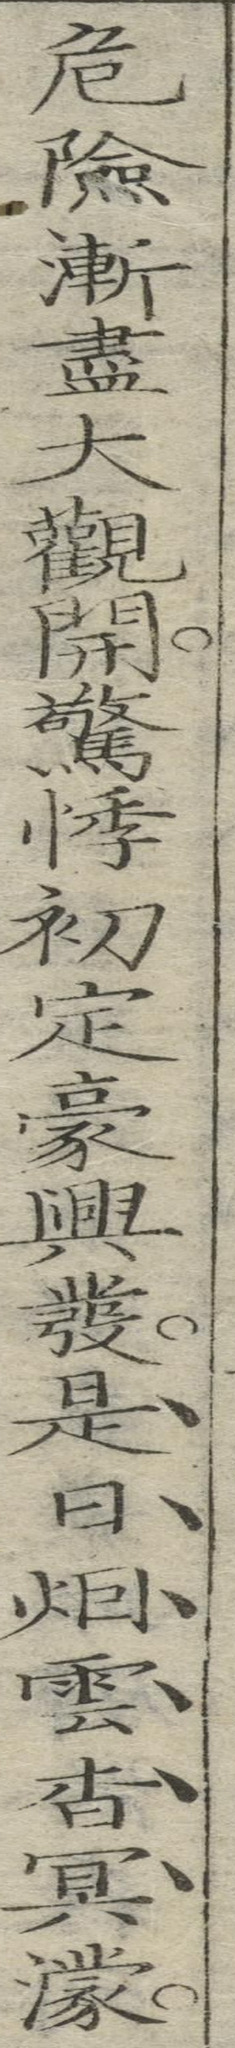危険漸盡大観開驚悸初定豪興発是日煙雲杳冥濛
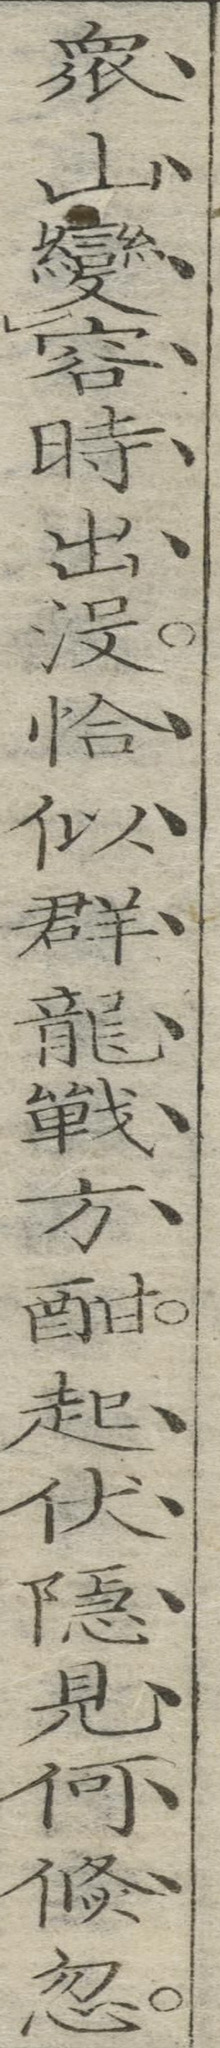衆山変容時出没恰似群龍戦方酣起伏隠見何倐忽
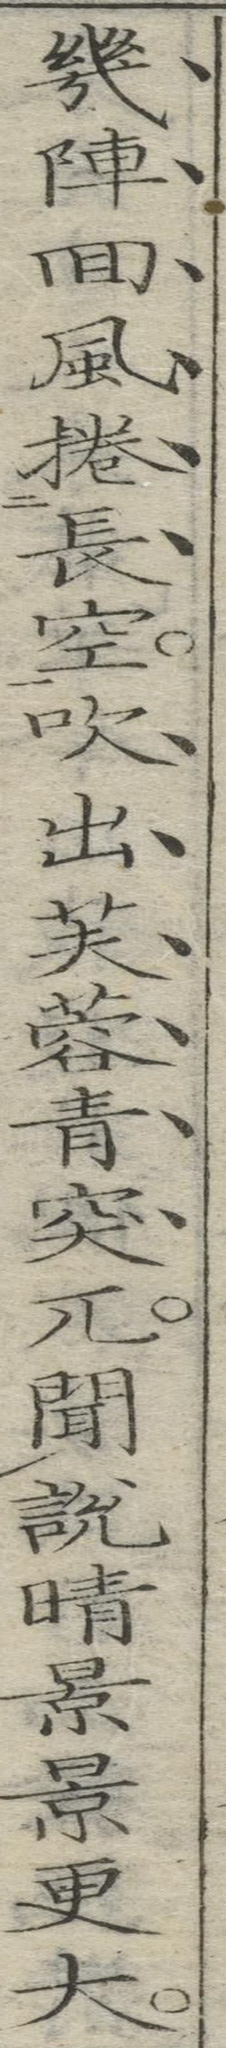幾陣回風捲長空吹出芙蓉青突兀聞説晴景景更大
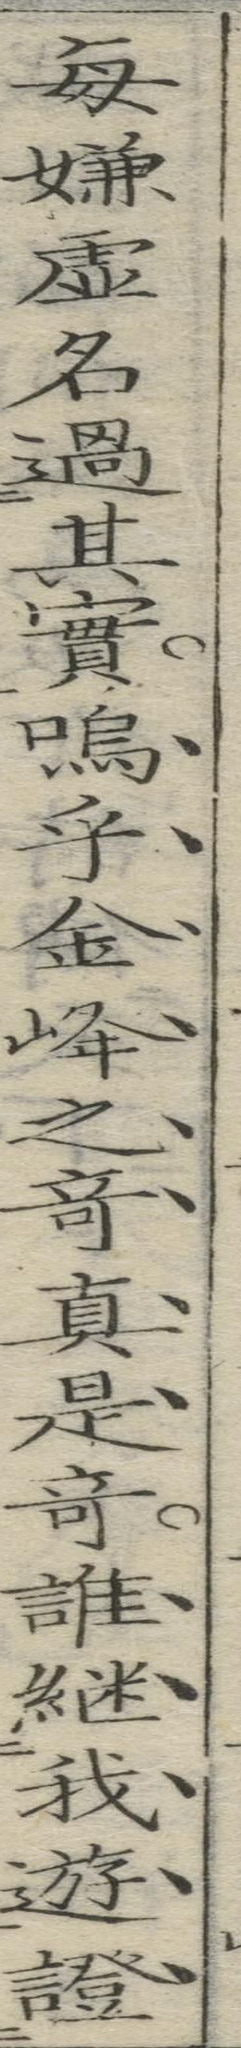毎嫌虚名過其実嗚呼金峰之奇真是奇誰継我遊證
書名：火後憶得詩
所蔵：東京大学地震研究所図書室 Earthquake Research Institute Library, The University of Tokyo, JAPAN
